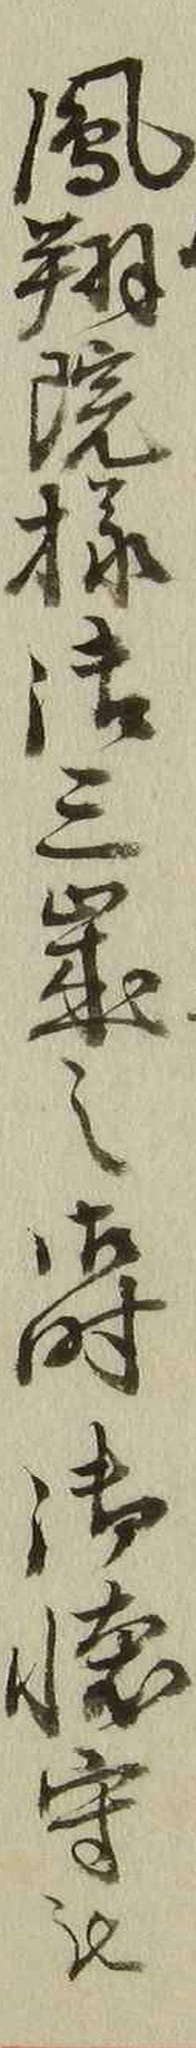鳳翔院様御三歳之御時御懐守被
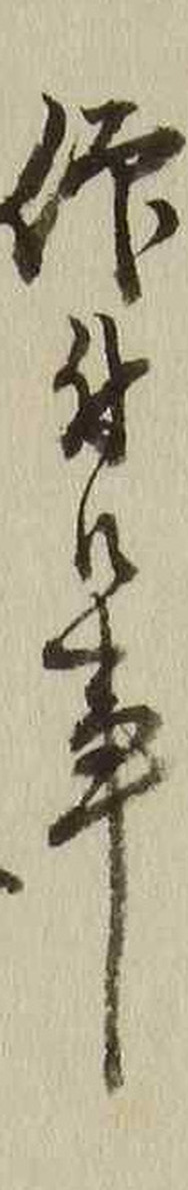仰付候事
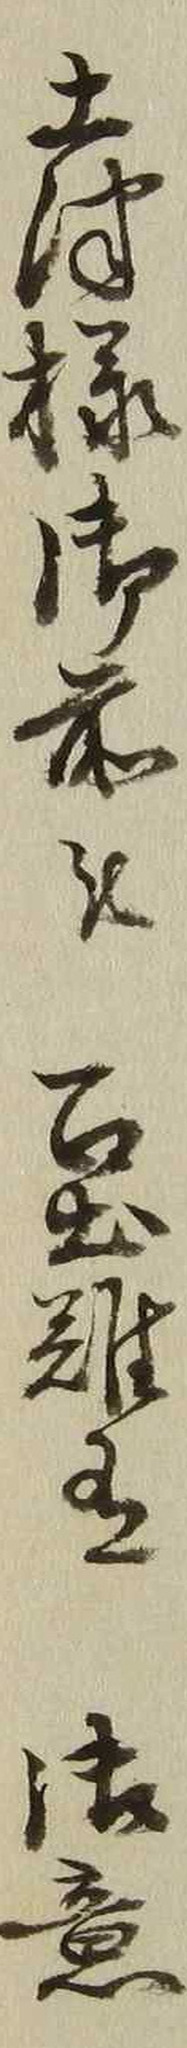土津様御前被召出難有御意
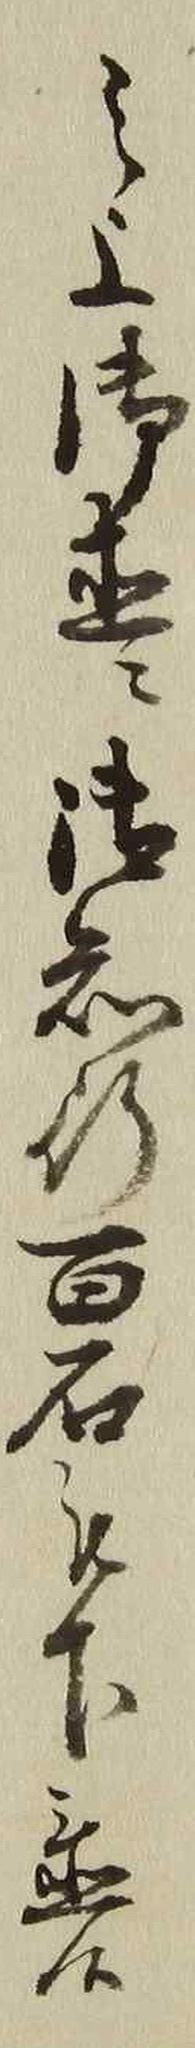之上御直ニ御知行百石被下置候
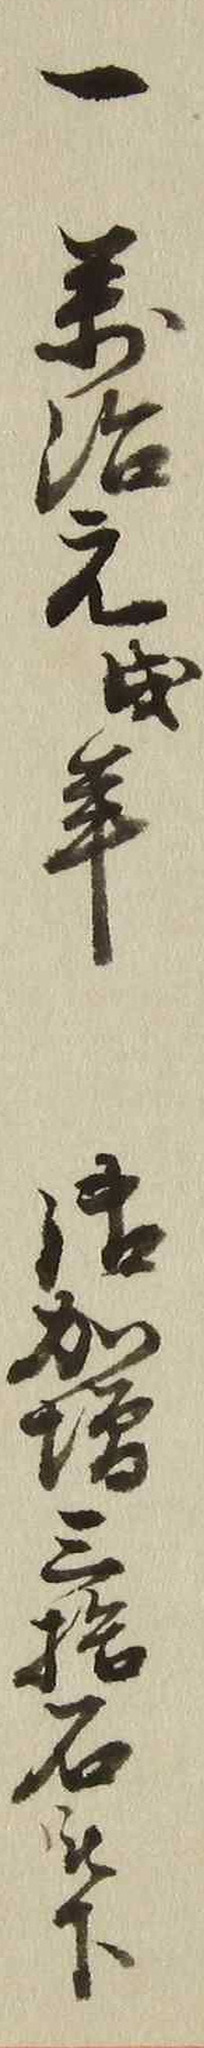一万治元戌年御加増三拾石被下
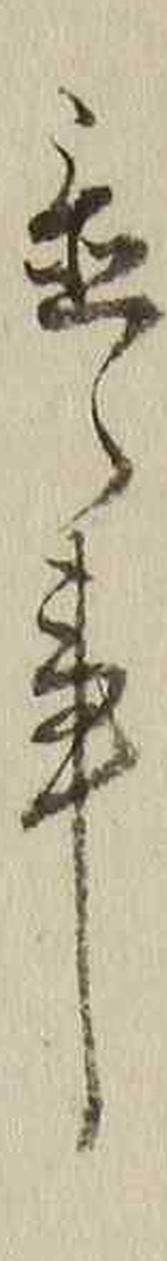置候事
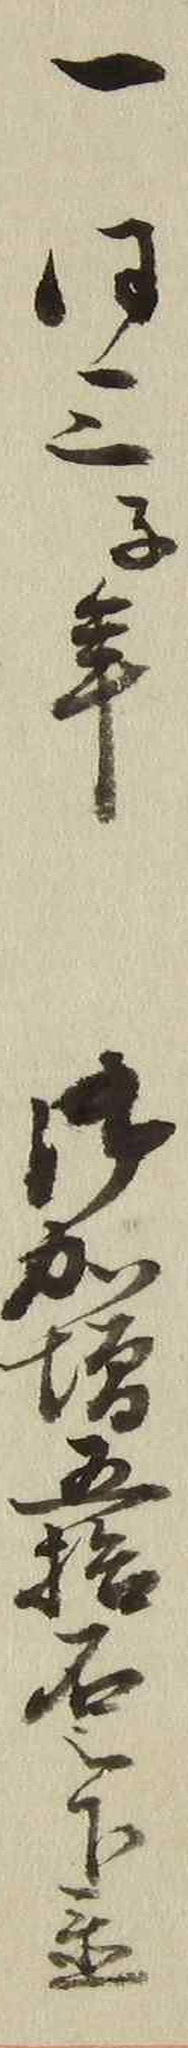一同三子年御加増五拾石被下置
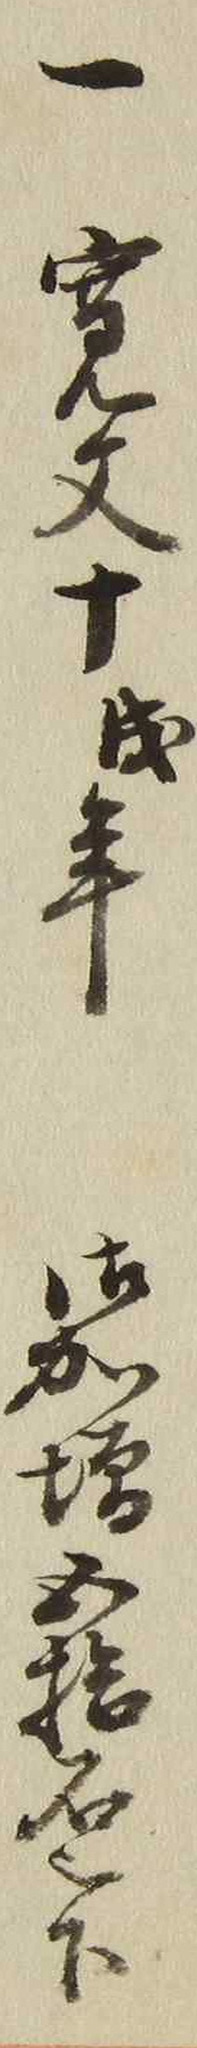一寛文十戌年御加増五拾石被下
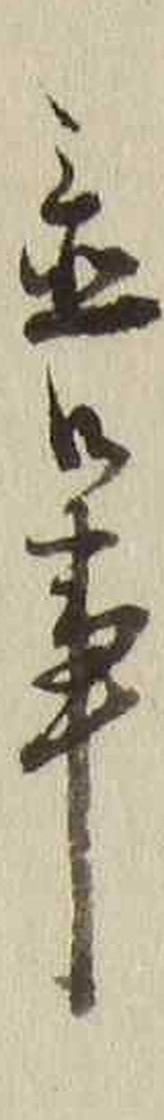置候事
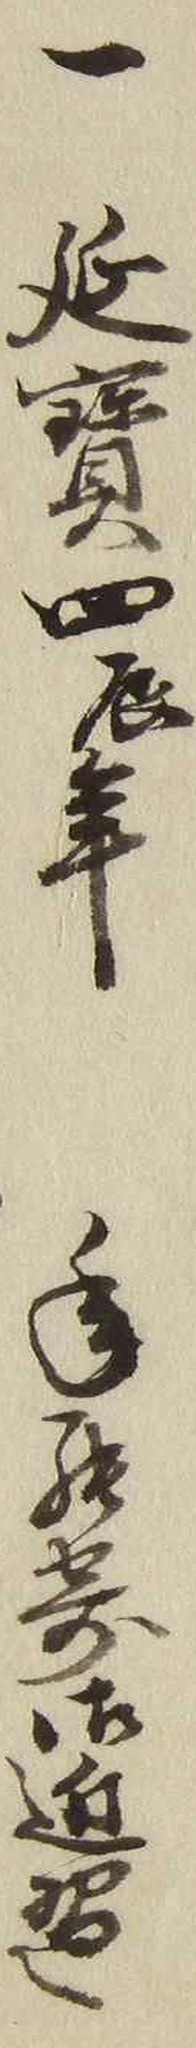一延宝四辰年年罷寄御近習之
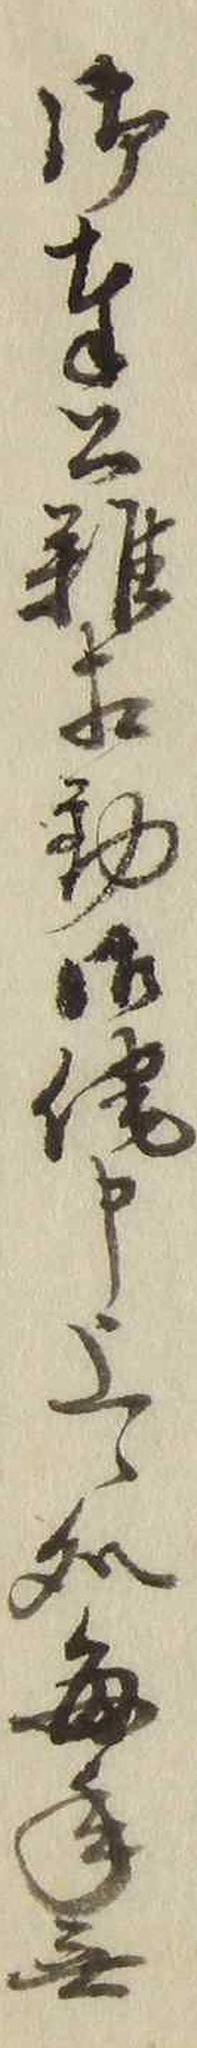御奉公難相勤御詫申上候処毎年無

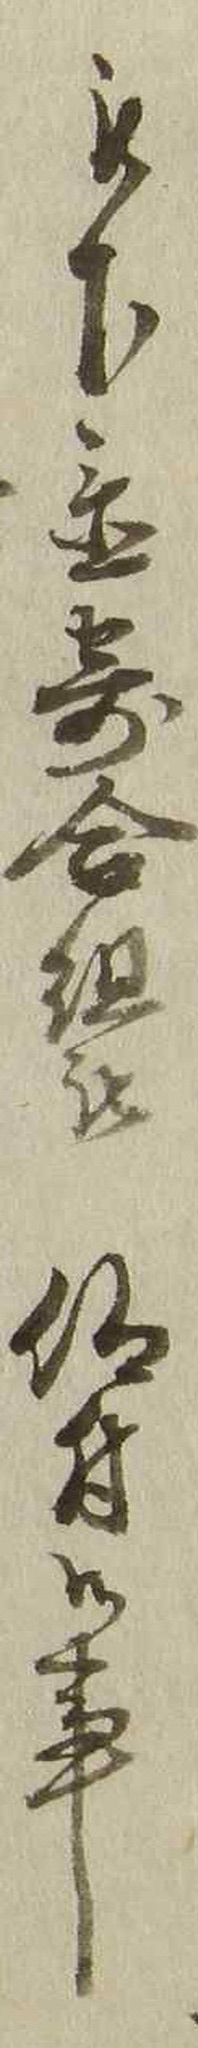被下置寄合組被仰付候事
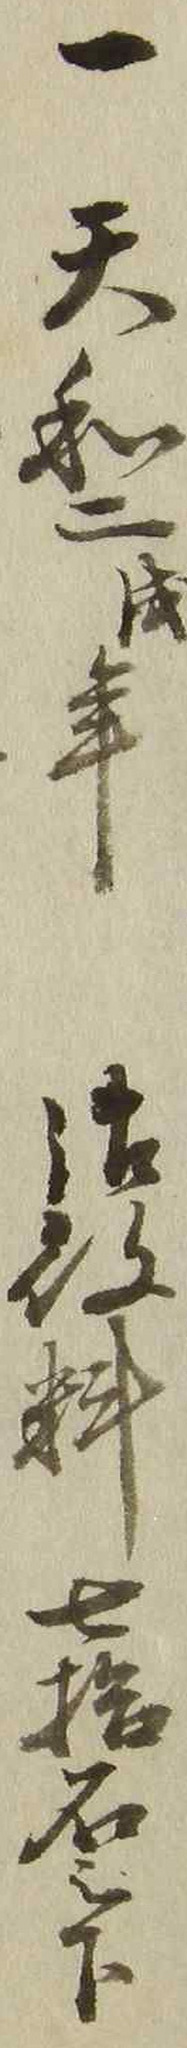一天和二亥年御役料七拾石被下
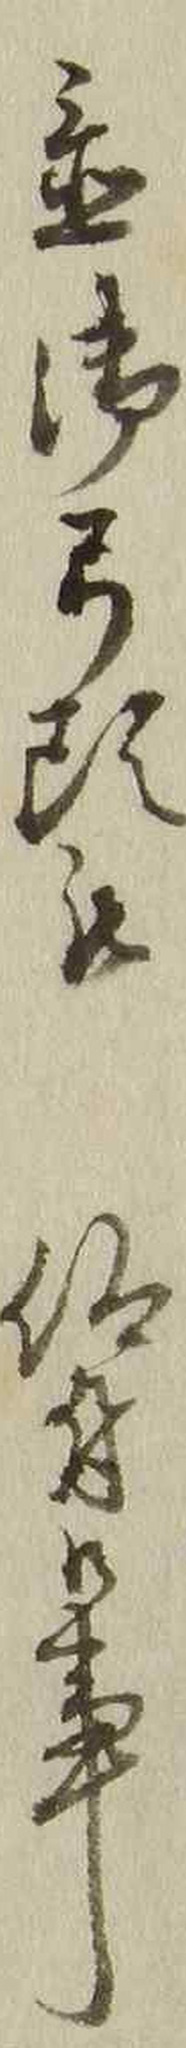置御弓頭被仰付候事
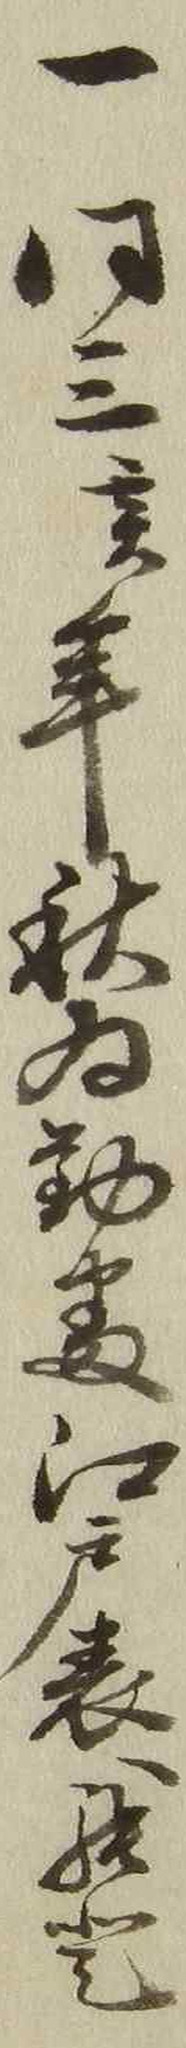一同三亥秋為勤番江戸表へ罷登
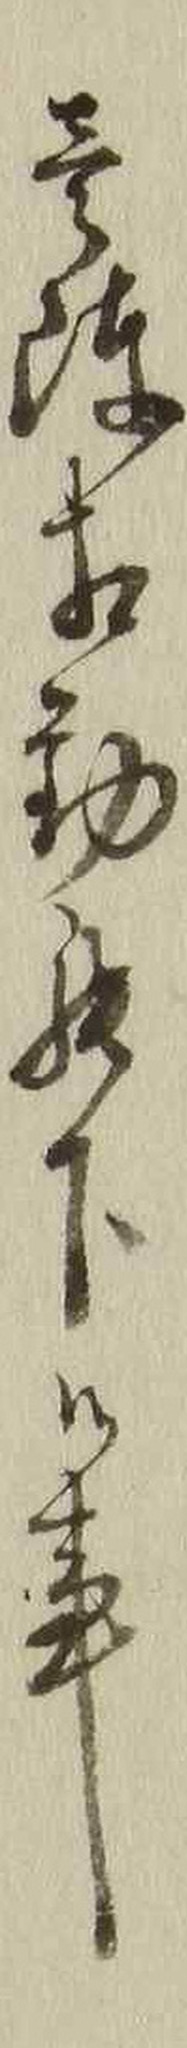壱陣相勤罷下候事
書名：諸士系譜　巻之31　い之部31
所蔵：会津若松市立会津図書館
